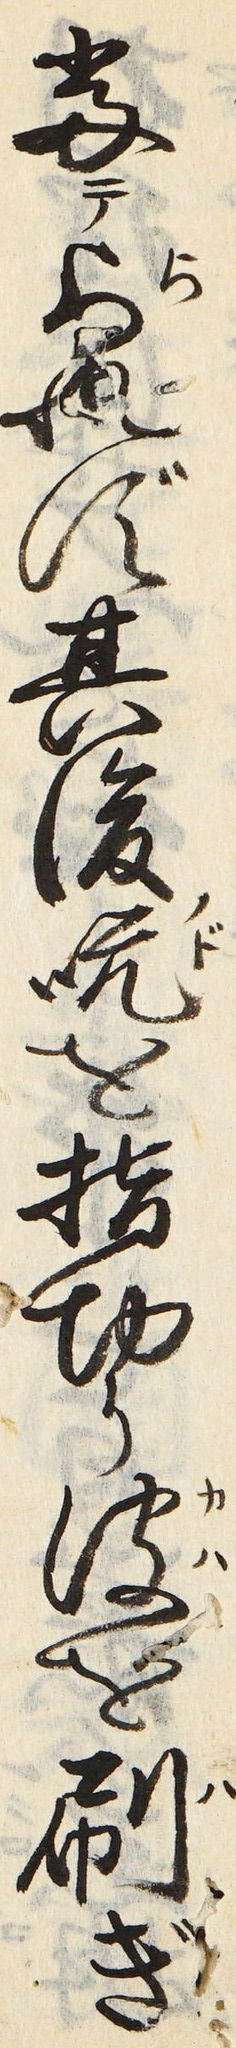当てられず其後吭を指切り皮を刷ぎ
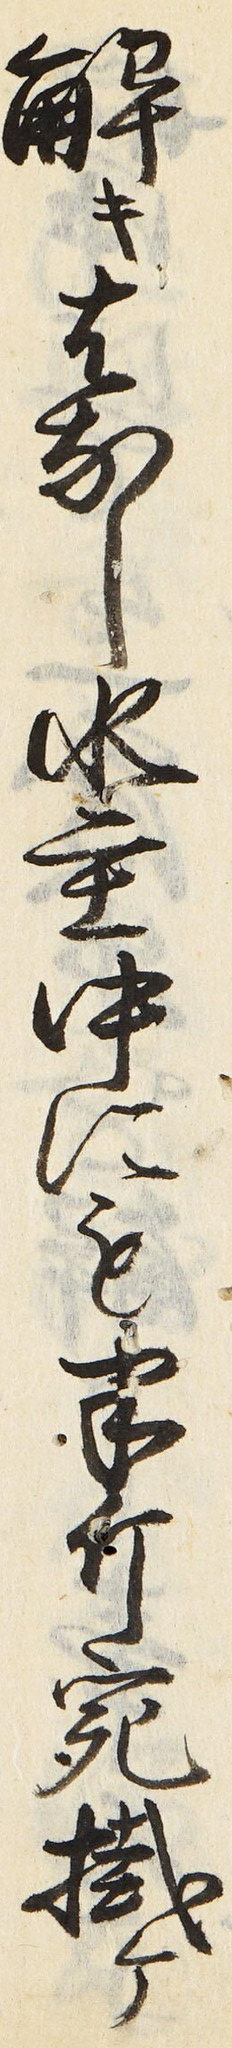解きはなし水主中にも半斤宛掛け
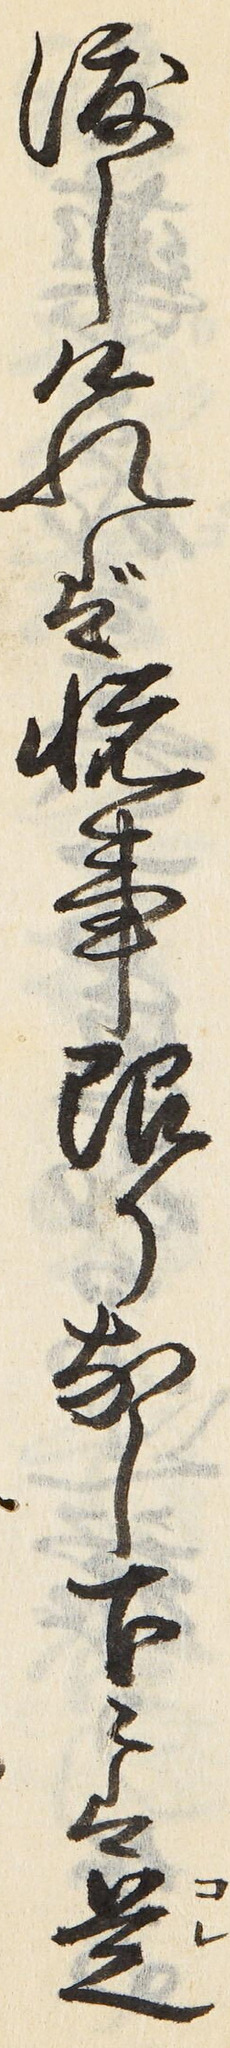渡しければ祝事限りなし下々は是
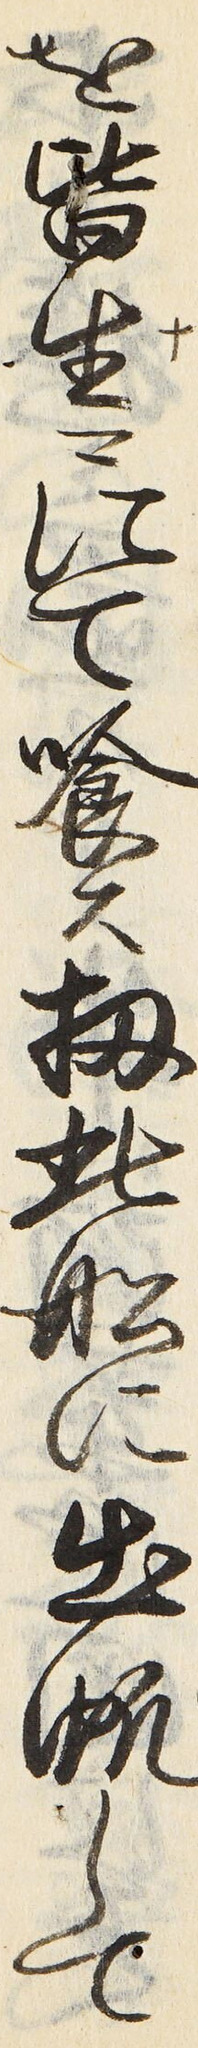を皆生まにて喰す扨此船に出帆して
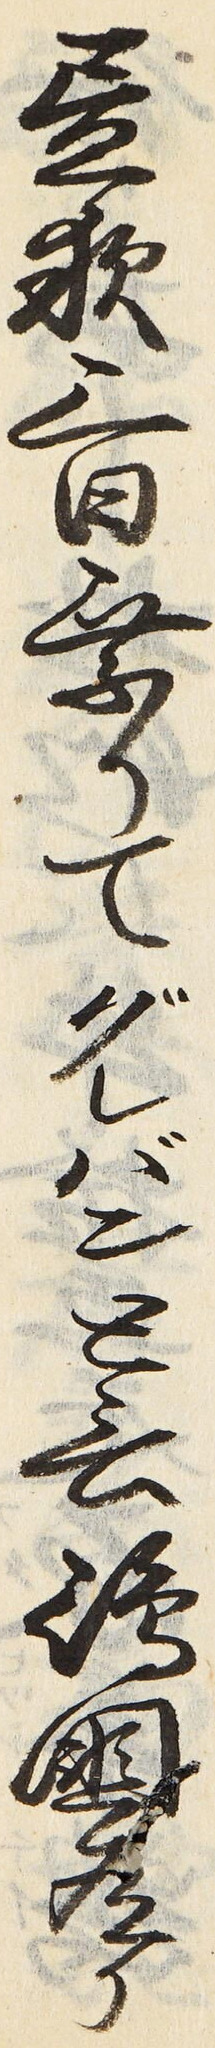昼夜三日乗りてグレバンと云島国有り
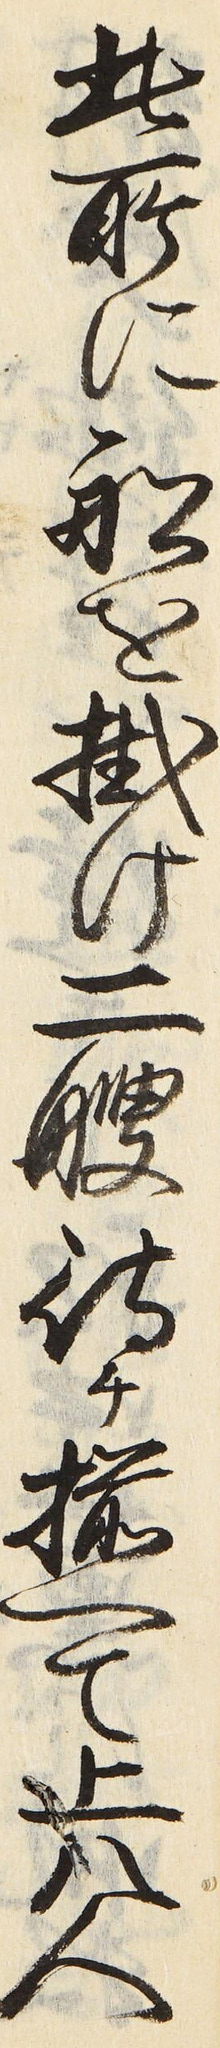此所に船を掛け二艘待ち揃へて上八人
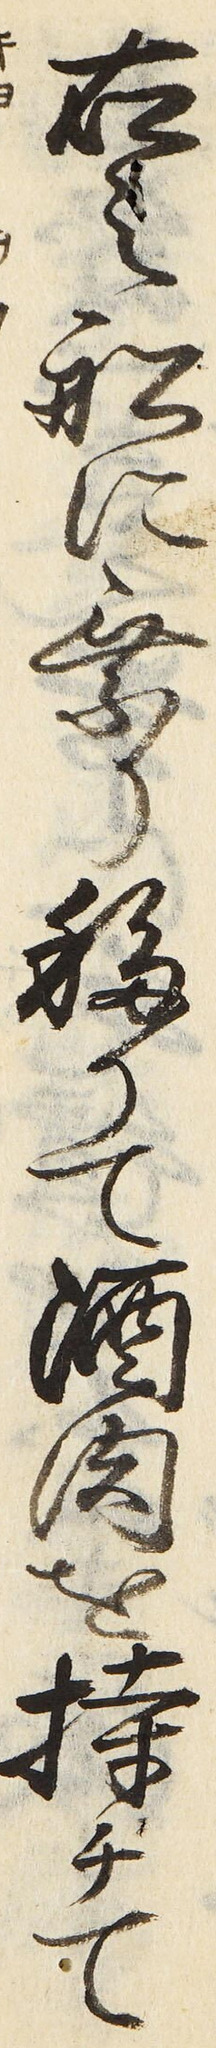右の船に乗り移りて酒肉を持ちて
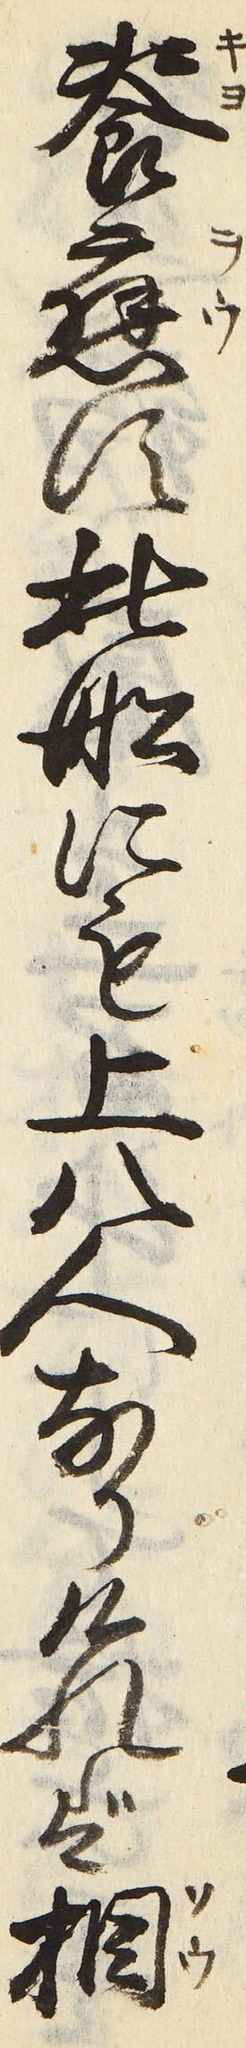饗応す此船にも上八人なりければ相
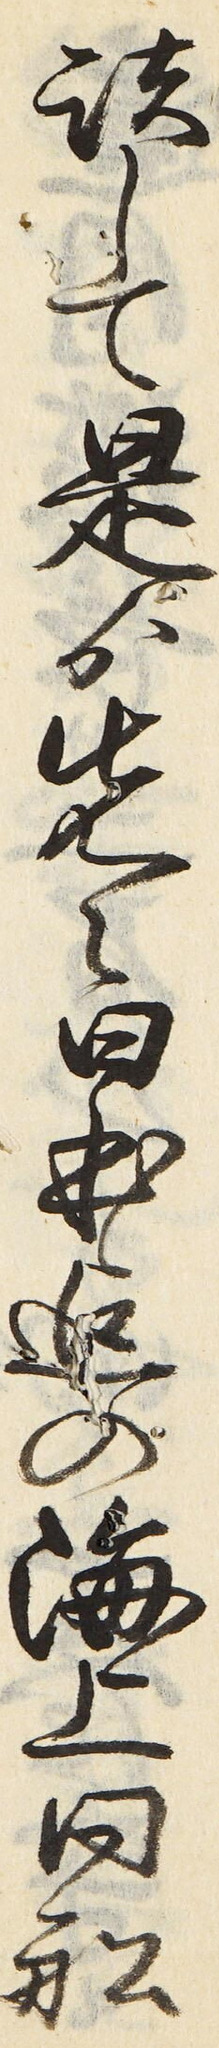談して是ゟ先々日本迠の海上同船
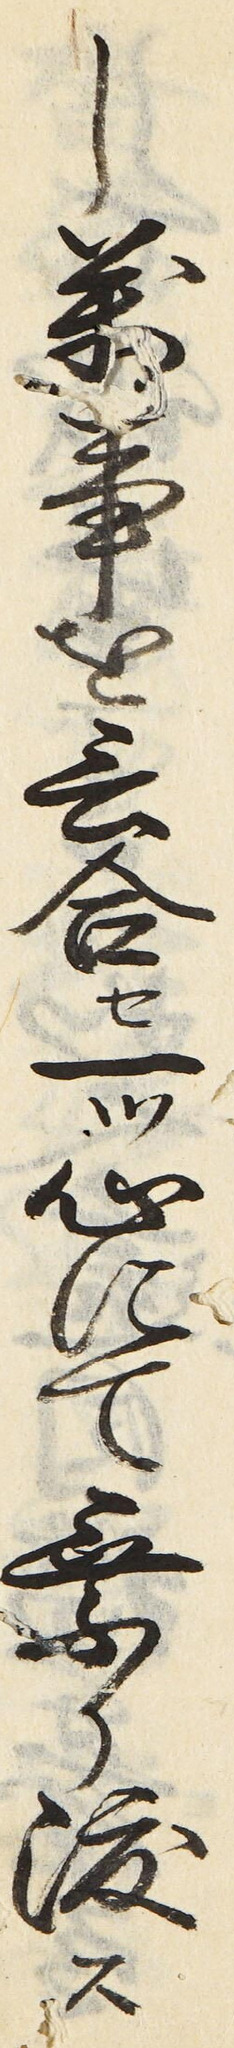し萬事を云合せ一ツ心にて乗り渡す
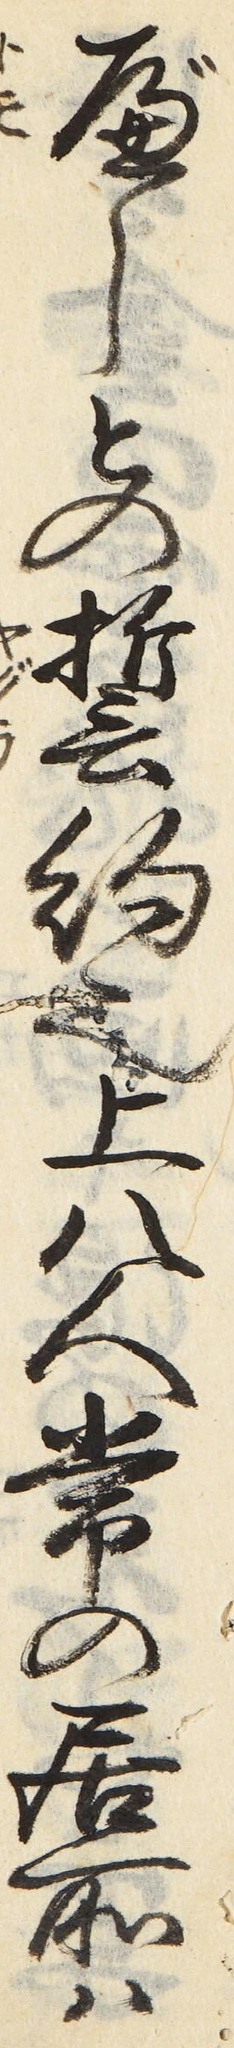べしとの誓約也上八人常の居所は
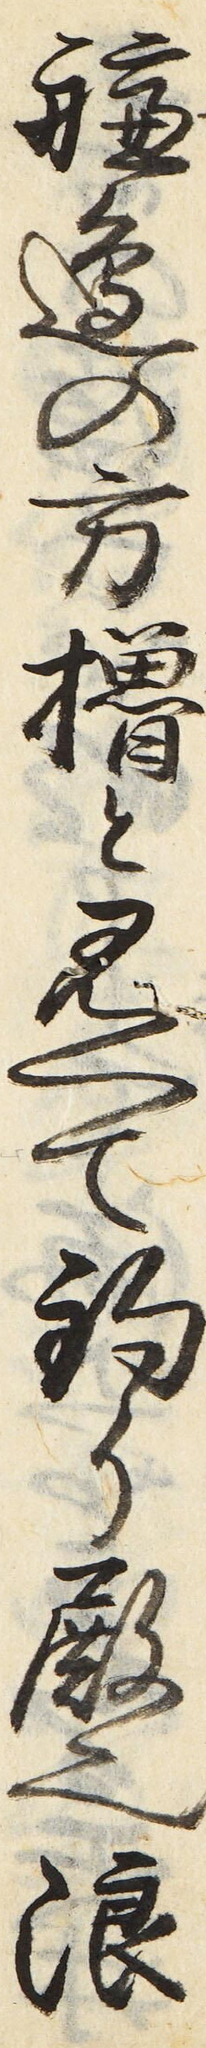艫辺の方櫓と見へて釣り殿也浪
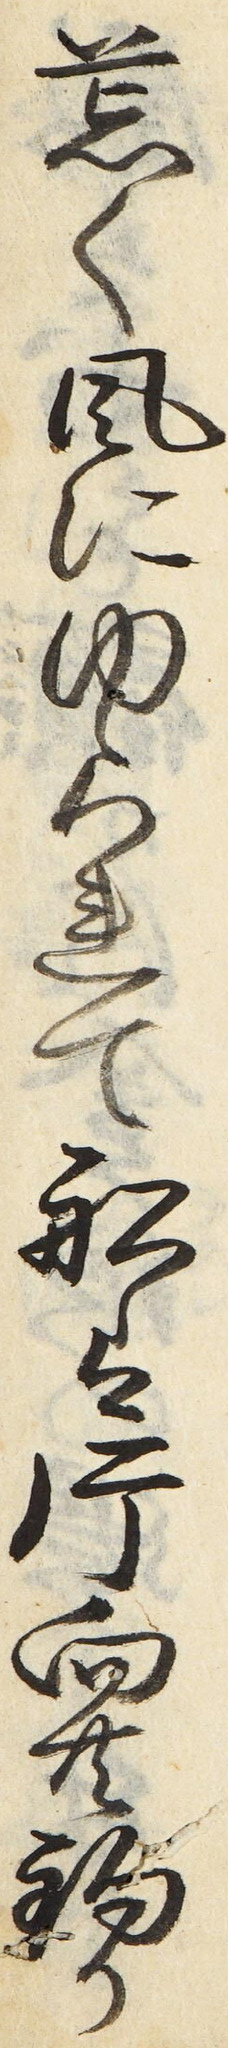荒く風にゆられて船は片向共釣り

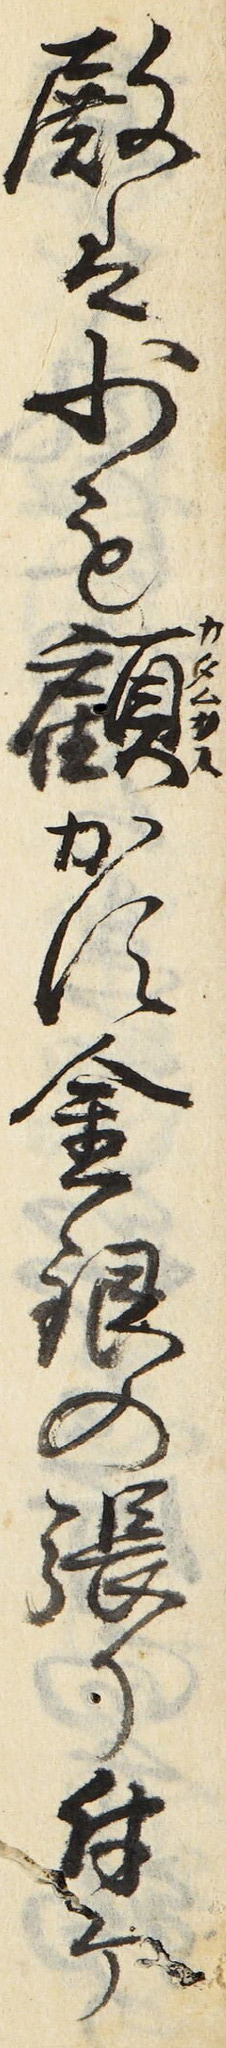殿は少も顧かす金銀の張り付け
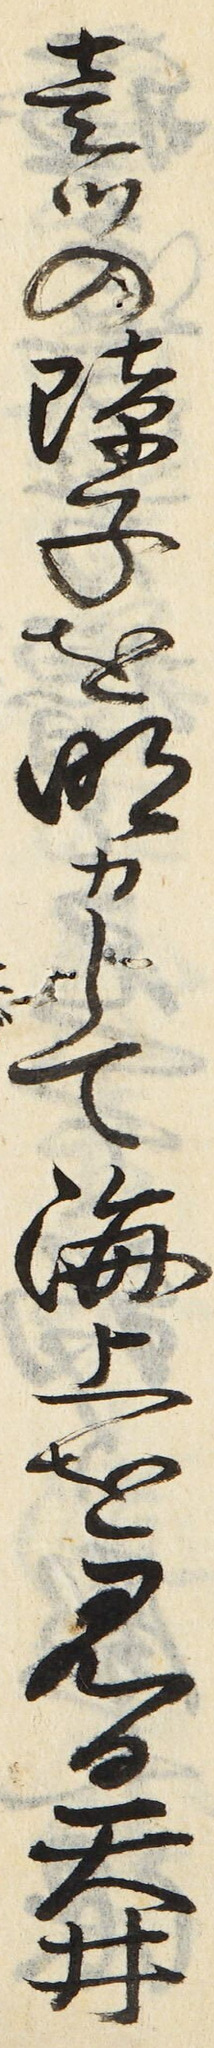壱ツの障子を明かして海上を見る天井
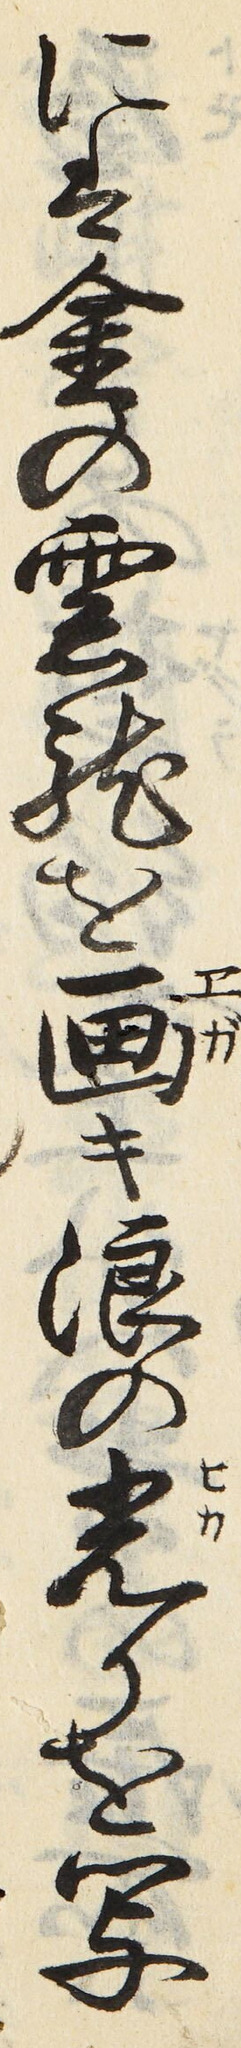には金の雲龍を画き浪の光りを写
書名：華夷九年録
